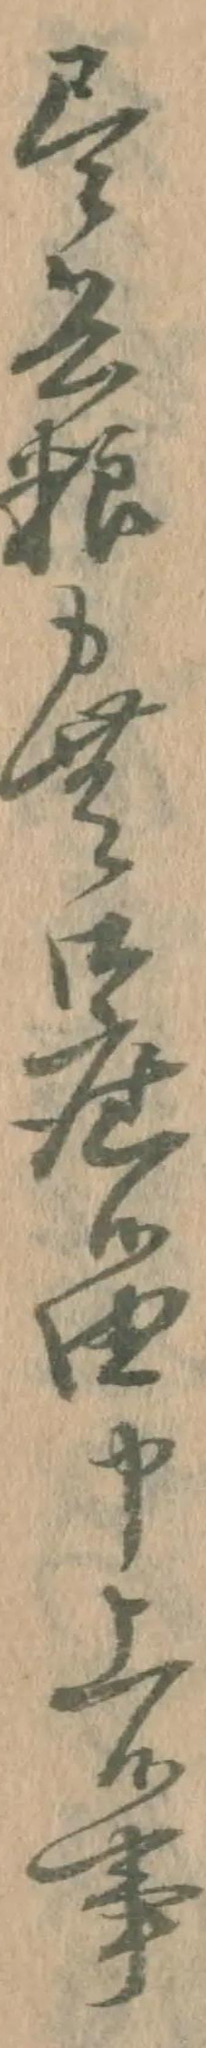尽兵粮も無御座候由申上候事
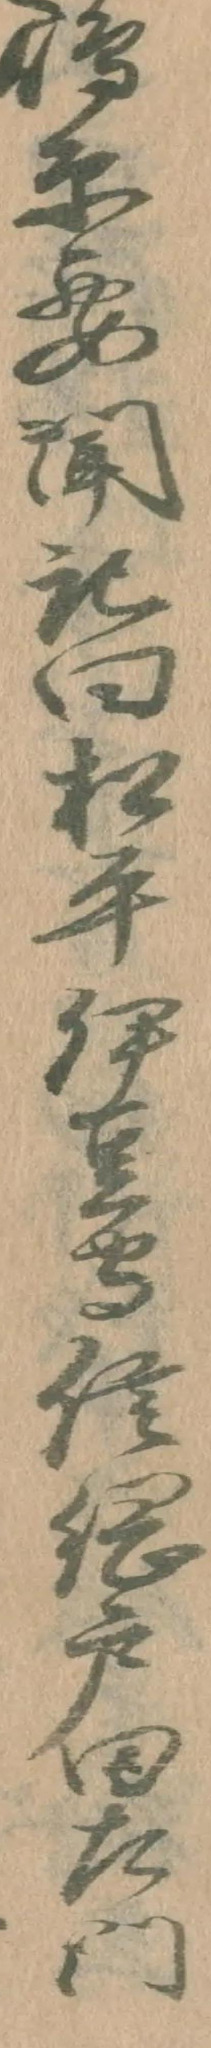島原要聞記曰松平伊豆守信綱戸田左門
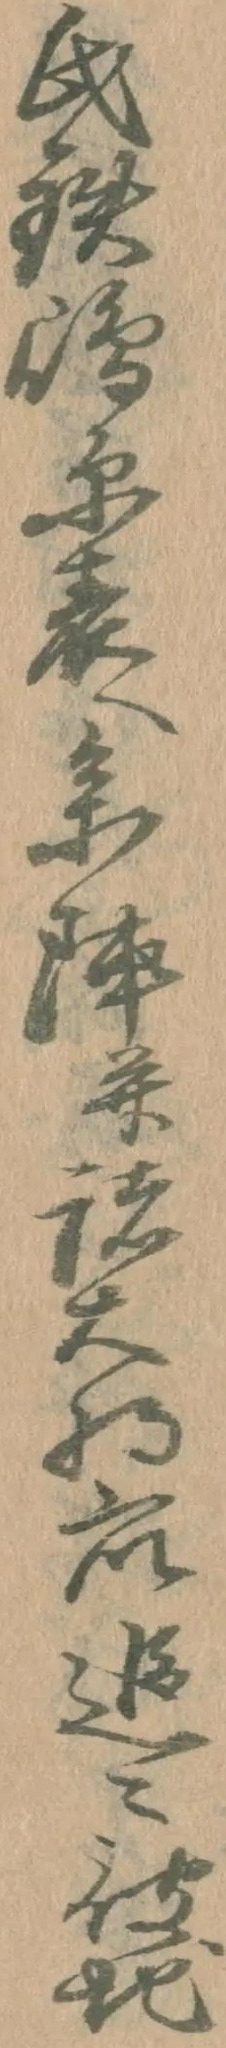止氏鉄島原表へ参陣幷諸大将衆追々彼地
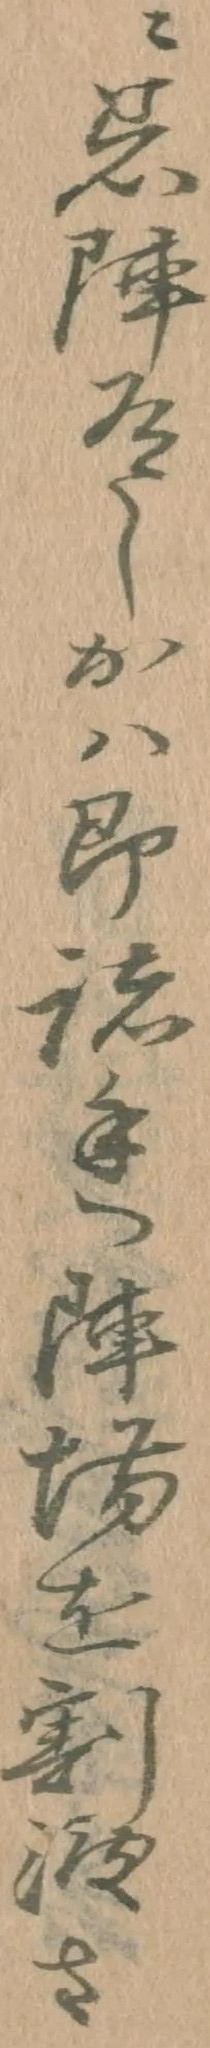に着陣有しかは即諸手へ陣場を割渡さ
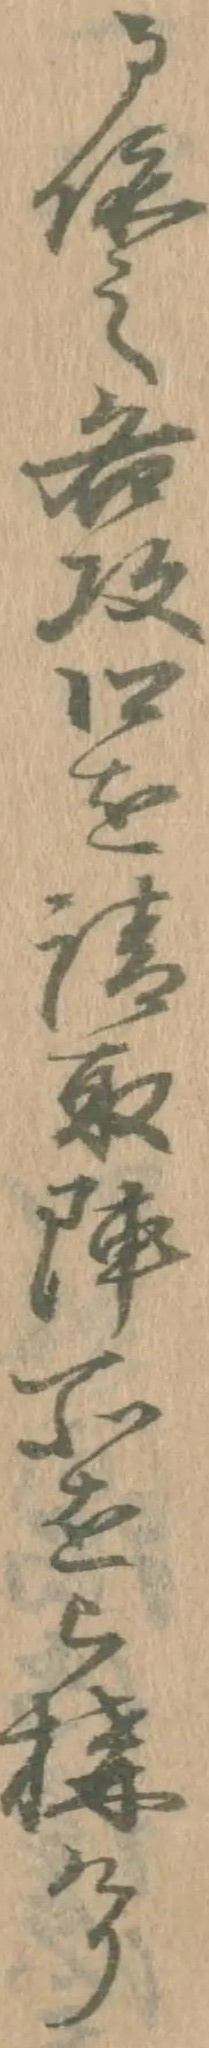る依之各攻口を請取陣所を被構けり
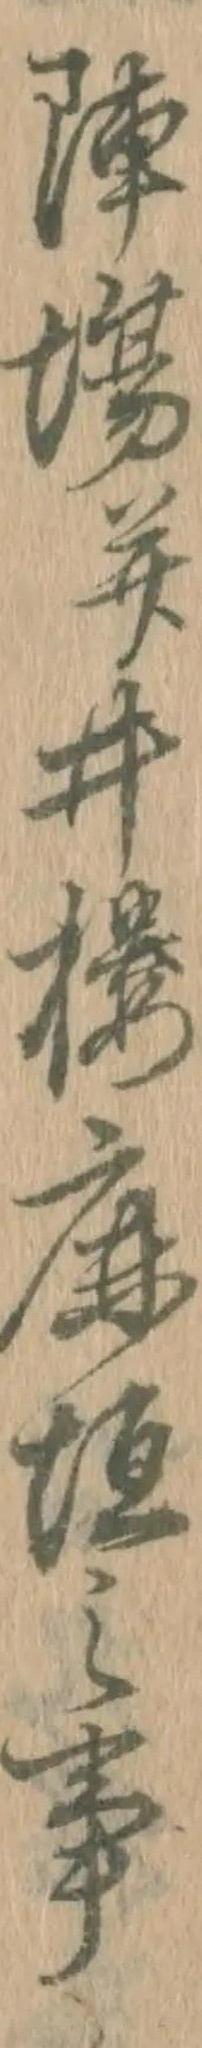陣場幷伊井樓廉垣之事
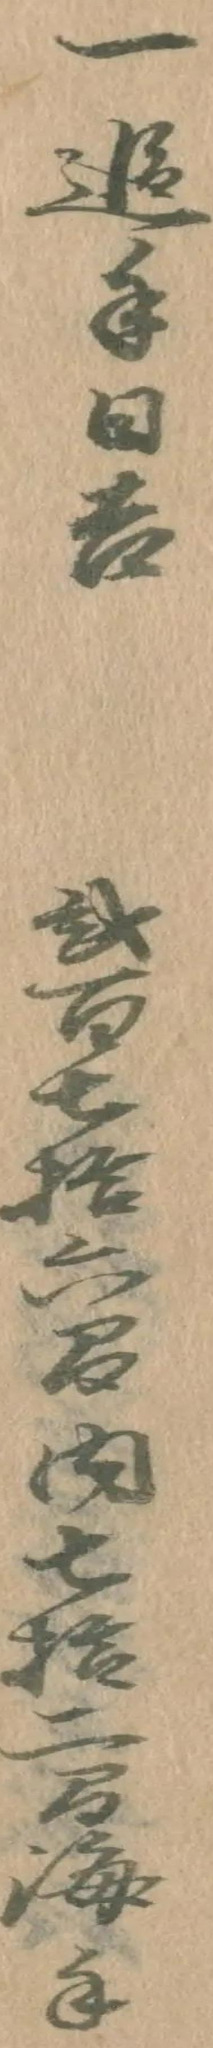一追手日吉弐百七拾六間内七拾二間海手
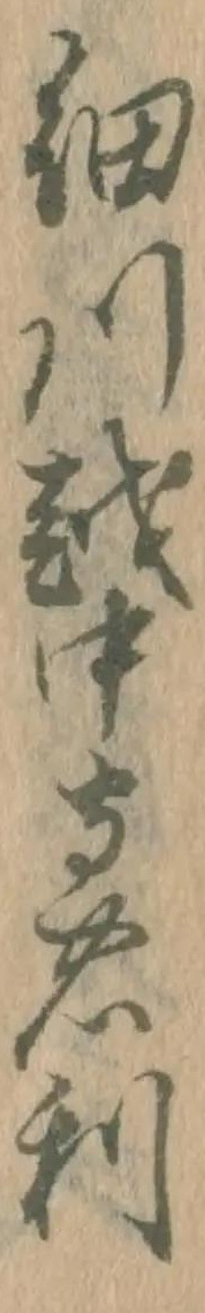細川越中守忠利
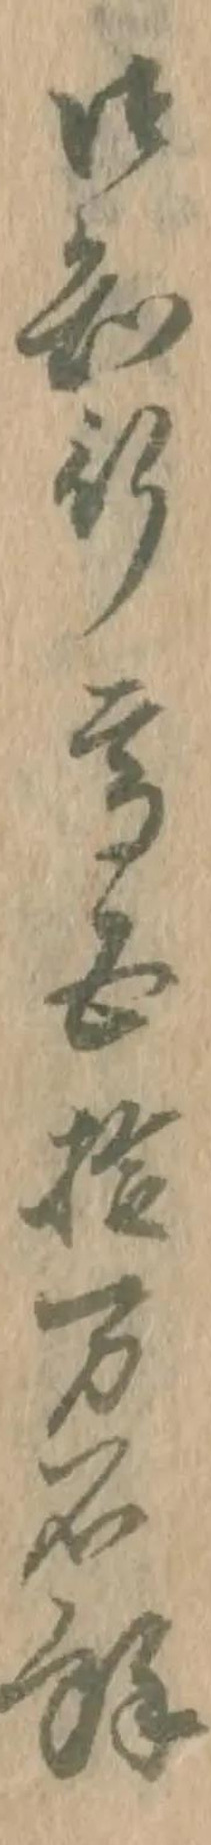御知行高五拾万石余
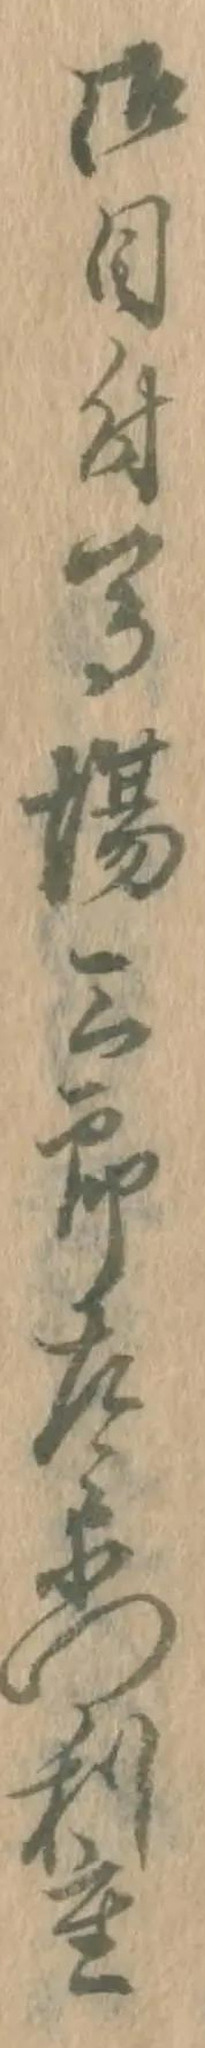御目付馬場三郎左衛門利重
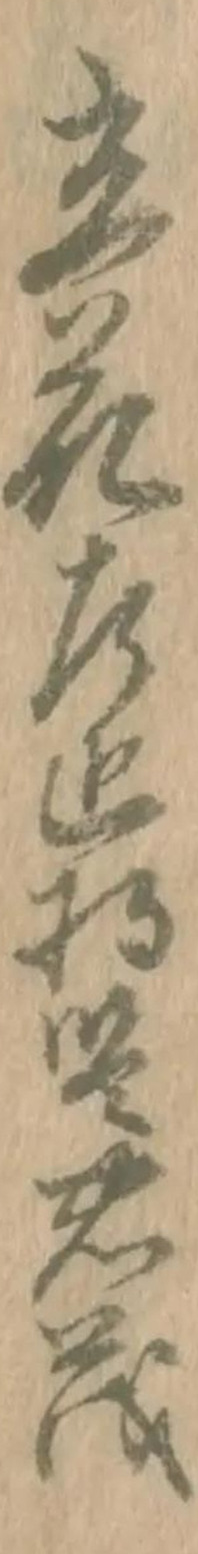立花左近将監忠茂
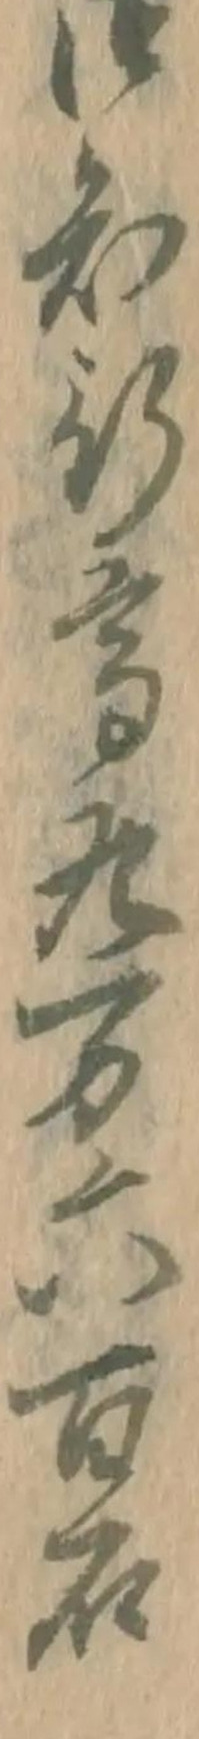御知行高九万六百石

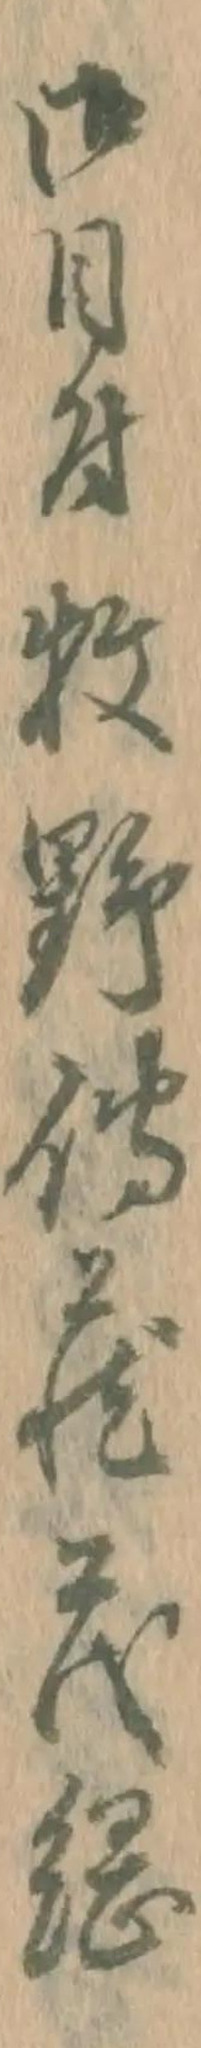御目付牧野伝蔵茂綱
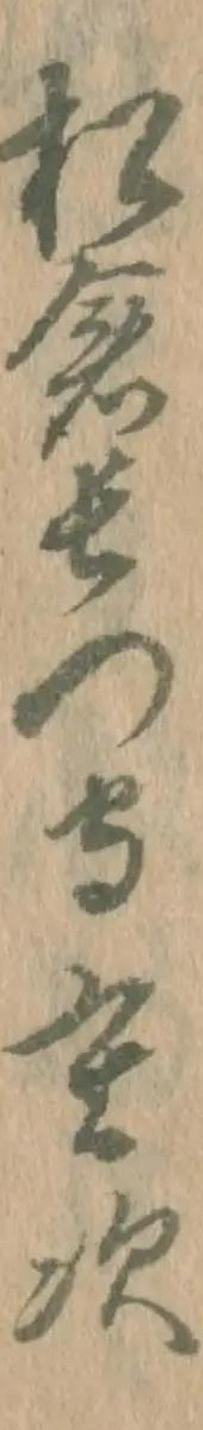松倉長門守重次
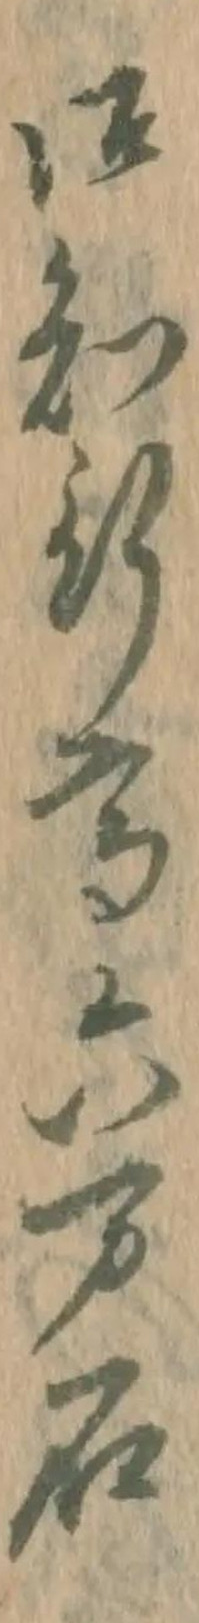御知行高六万石
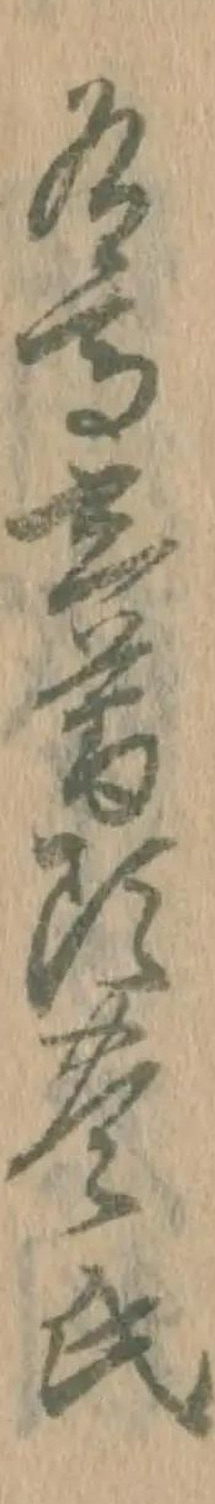有馬玄蕃頭豊氏
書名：切支丹御退治記 49巻. [5]
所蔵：国立国会図書館 National Diet Library, JAPAN
